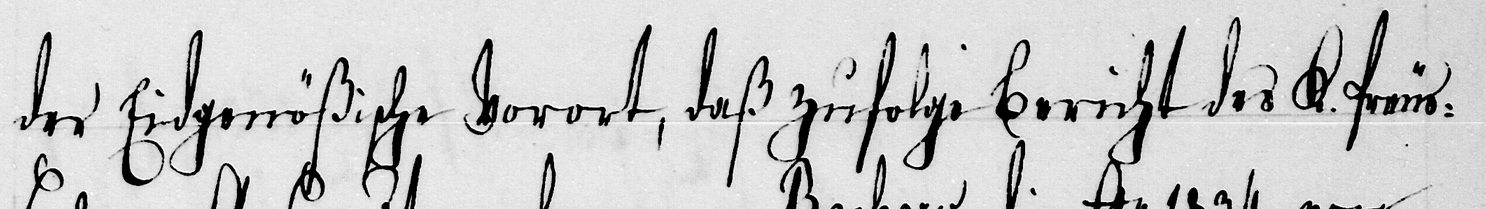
der Eidgenößische Vorort, daß zufolge Bericht des K. Preu¬
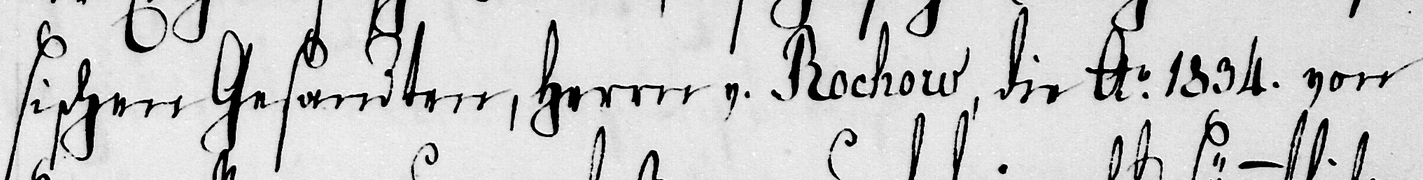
ßischen Gesandten, Herrn v. Rochow, die Ao. 1834. von
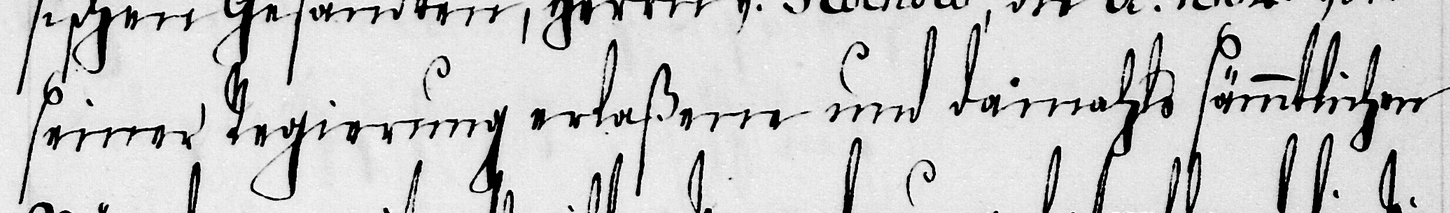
seiner Regierung erlaßene und damahls sämmtlichen
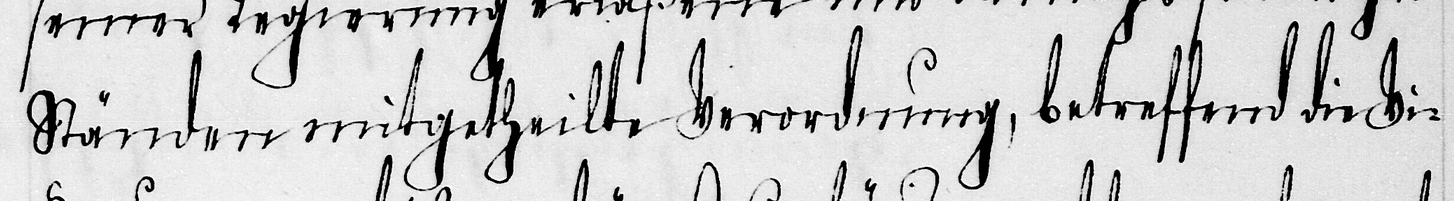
Ständen mitgetheilte Verordnung, betreffend die
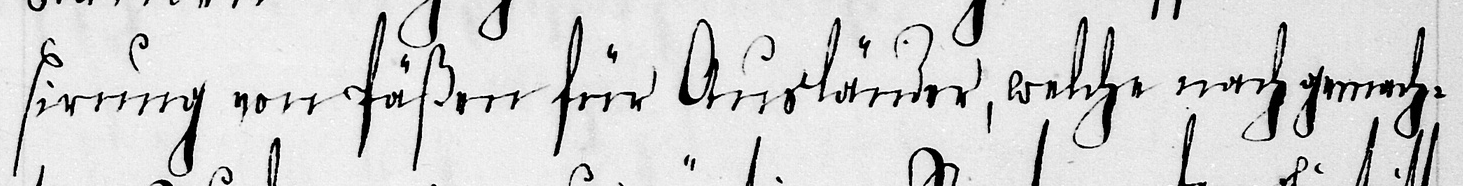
sirung von Päßen für Ausländer, welche nach gemach¬
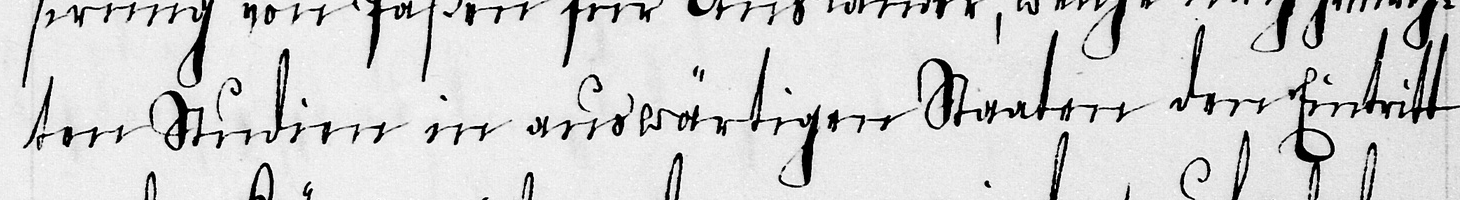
ten Studien in auswärtigen Staaten den Eintritt
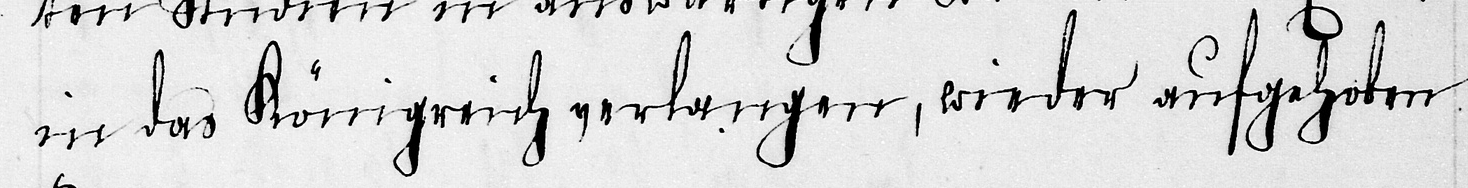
in das Königreich verlangen, wieder aufgehoben
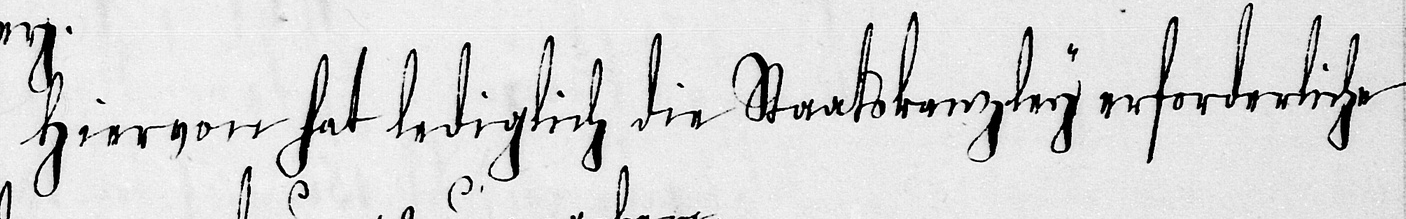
Hiervon hat lediglich die Staatskanzley erforderliche
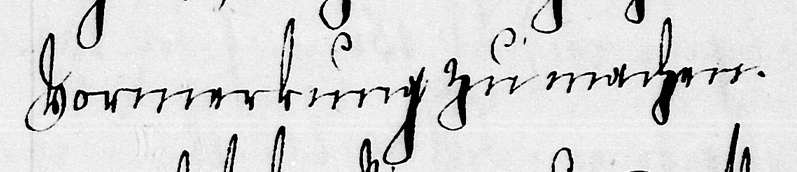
Vormerkung zu machen.
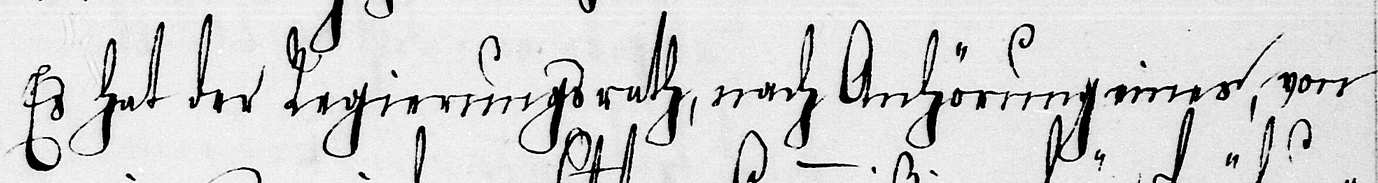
Es hat der Regierungsrath, nach Anhörung eines, von
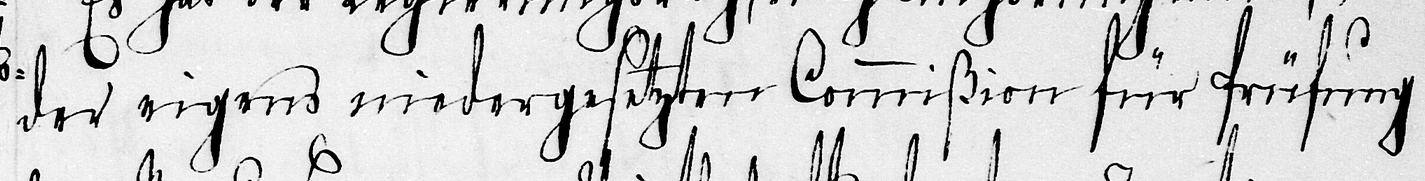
der eigens niedergesetzten Commißion für Prüfung
